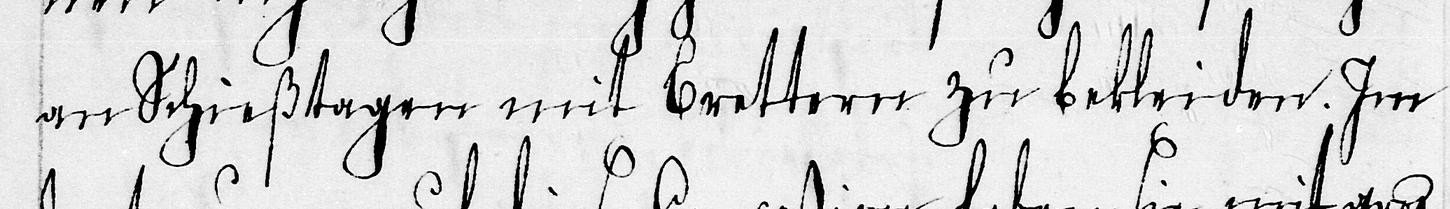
an Schießtagen mit Brettern zu bekleiden. Im
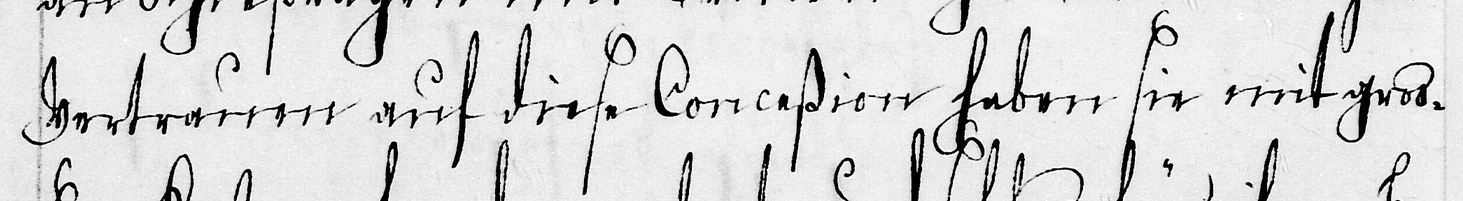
Vertrauen auf diese Conceßion haben sie mit gro¬
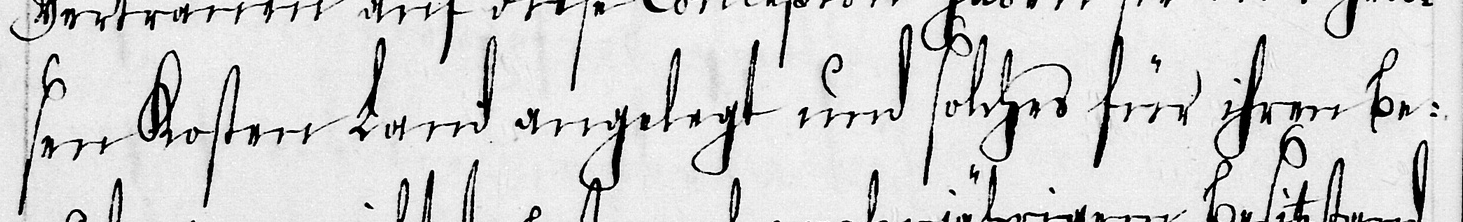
ßen Kosten Land angelegt und solches für ihren Be¬
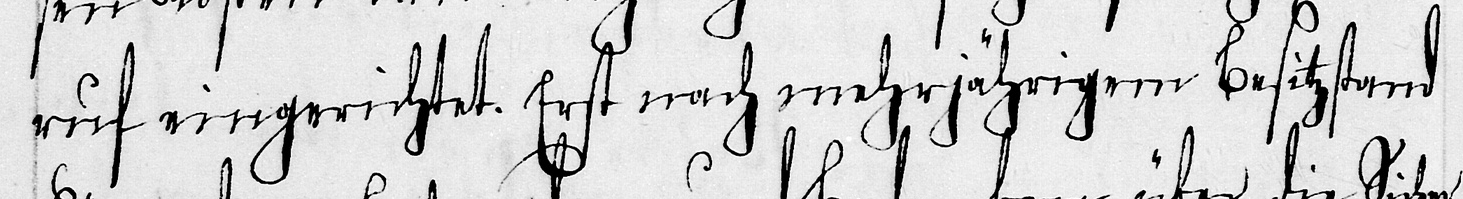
ruf eingerichtet. Erst nach mehrjährigem Besitzstand
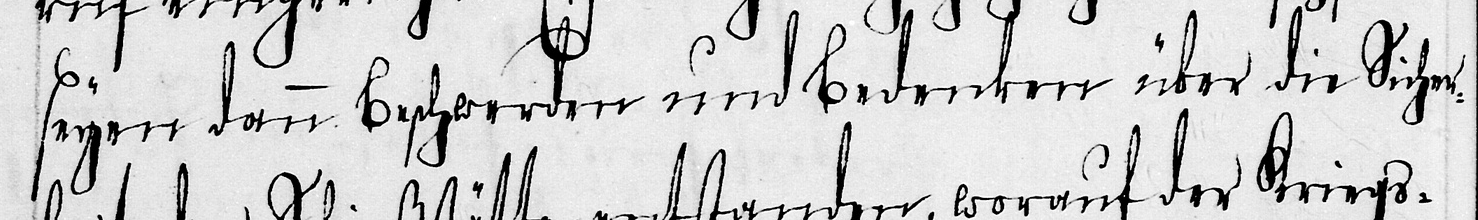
seyen dann Beschwerden und Bedenken über die Siche¬
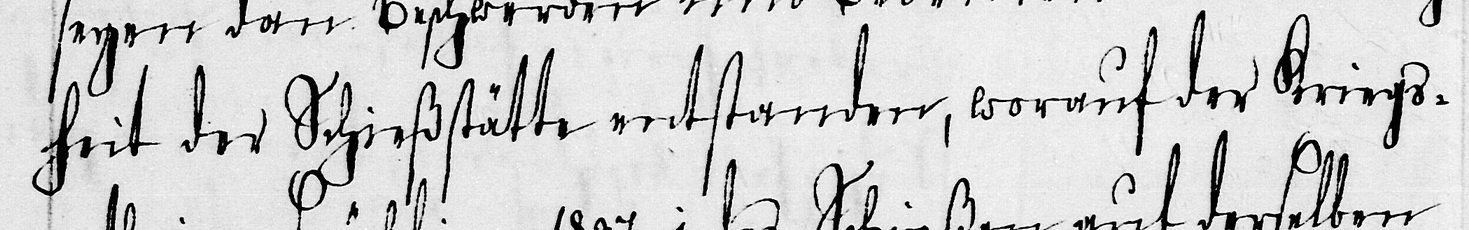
rheit der Schießstätte entstanden, worauf der Kriegs¬
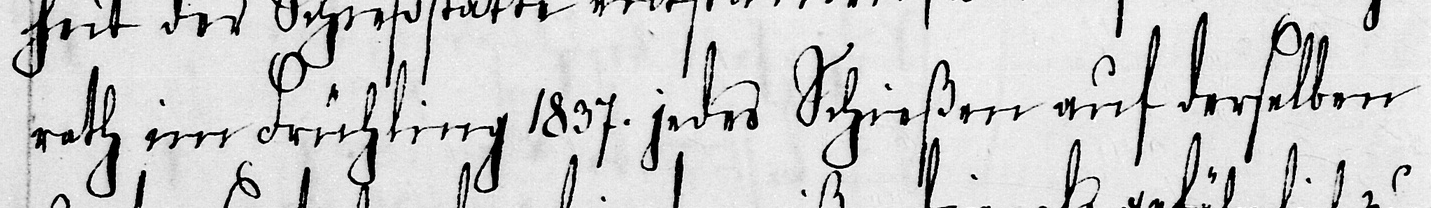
rath im Frühling 1837. jedes Schießen auf derselben
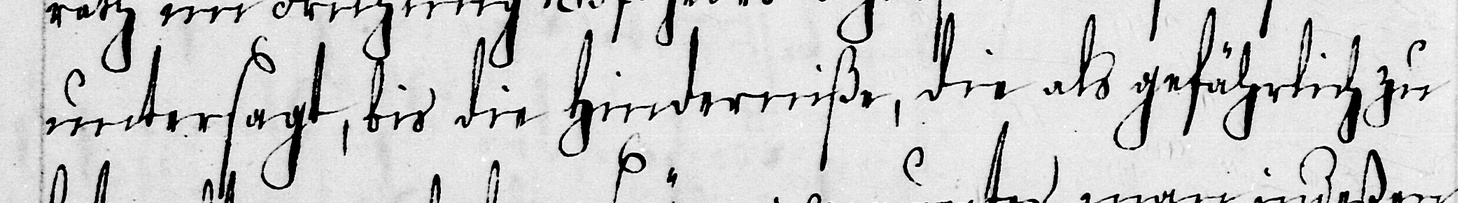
untersagt, bis die Hinderniße, die als gefährlich zu
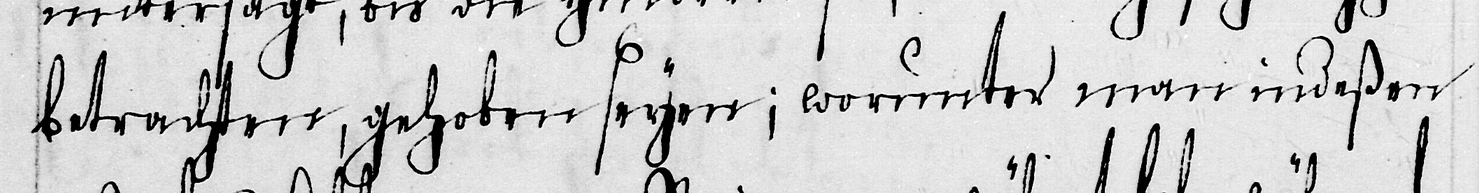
betrachten, gehoben seyen; worunter man indeßen
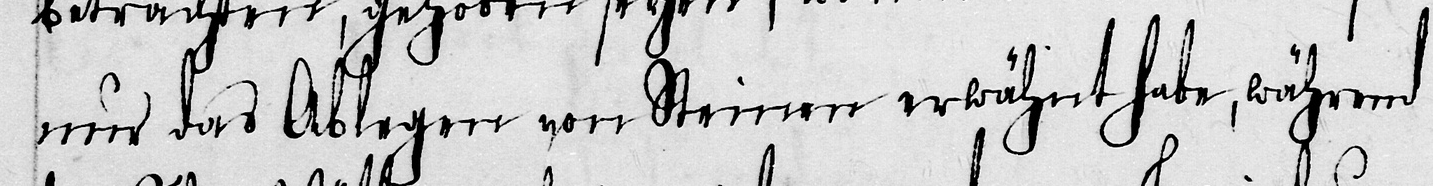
nur das Ablegen von Steinen erwähnt habe, während
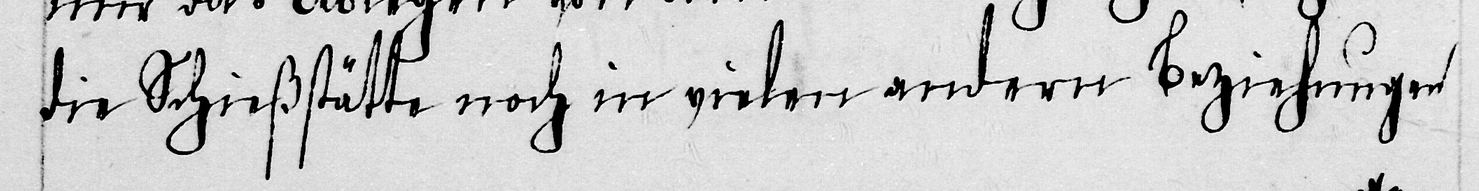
die Schießstätte noch in vielen andern Beziehungen
